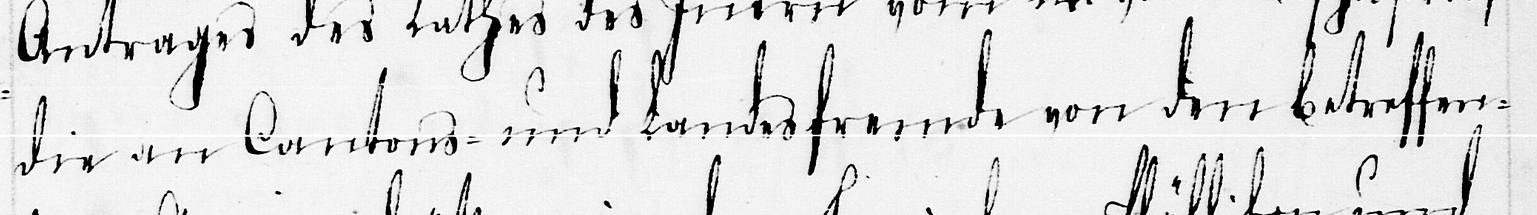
die an Cantons- und Landesfremde von den betreffe¬
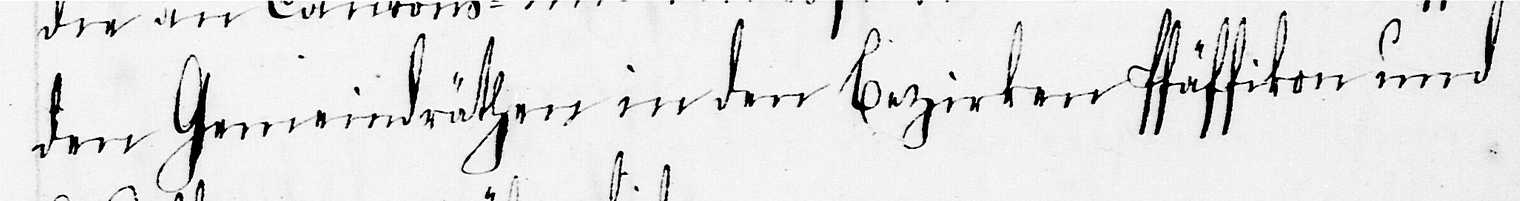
nden Gemeindräthen in den Bezirken Pfäffikon und
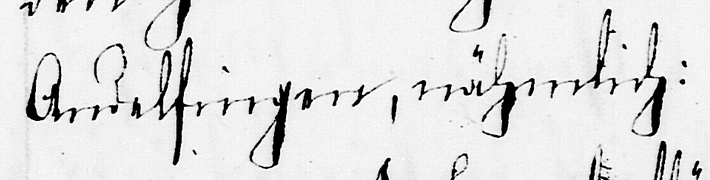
Andelfingen, nähmlich:
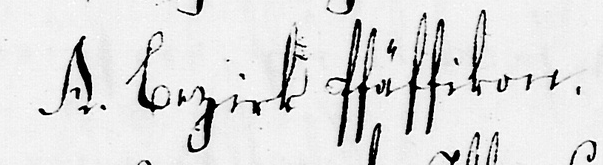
A. Bezirk Pfäffikon.
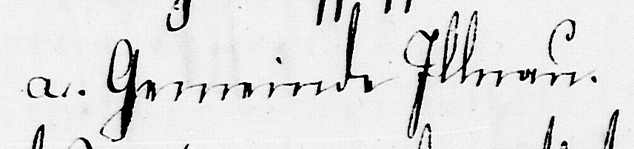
a. Gemeinde Illnau.
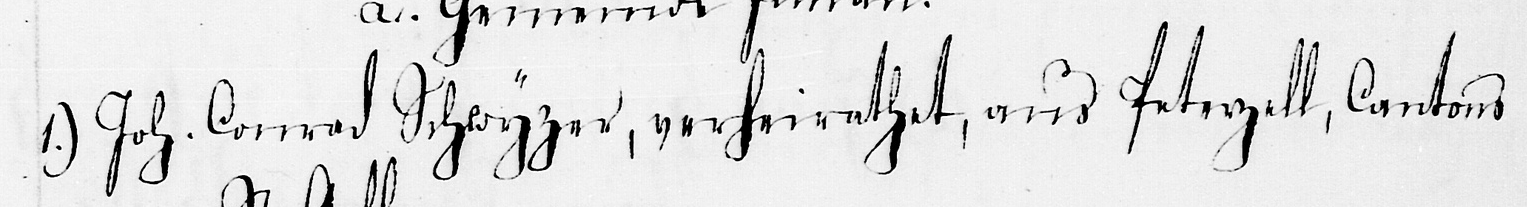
1.) Joh. Conrad Schwyzer, verheirathet, aus Peterzell, Cantons
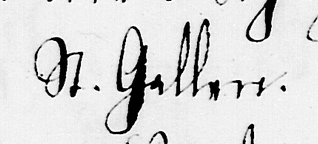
St. Gallen.
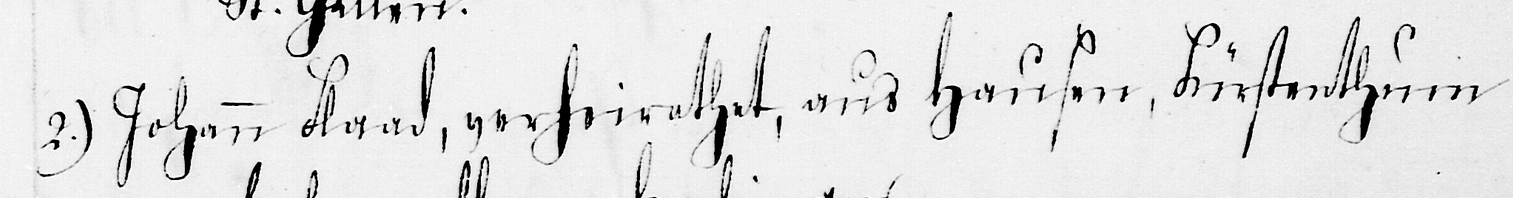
2.) Johann Flaad, verheirathet, aus Hausen, Fürstenthum
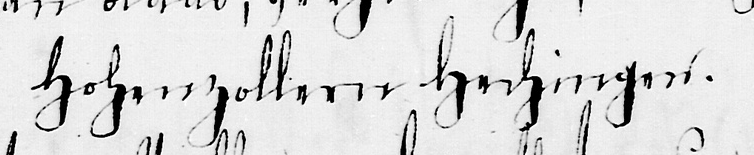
Hohenzollern Hechingen.
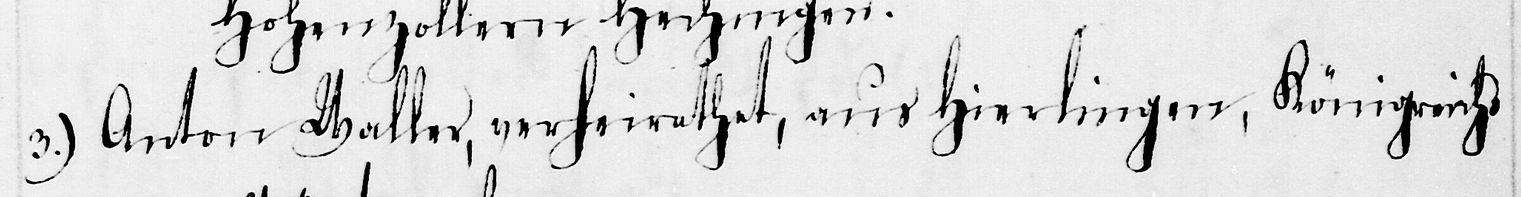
3.) Anton Waller, verheirathet, aus Hierlingen, Königreichs
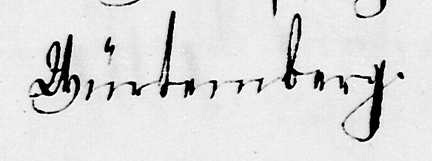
Würtemberg.
